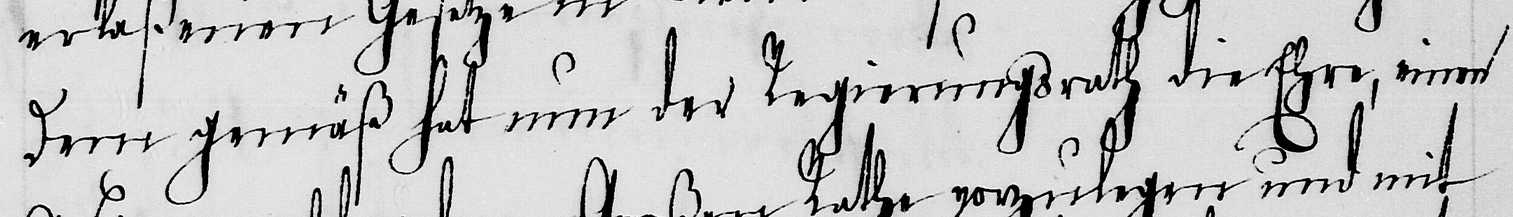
Dem gemäß hat nun der Regierungsrath die Ehre, einen
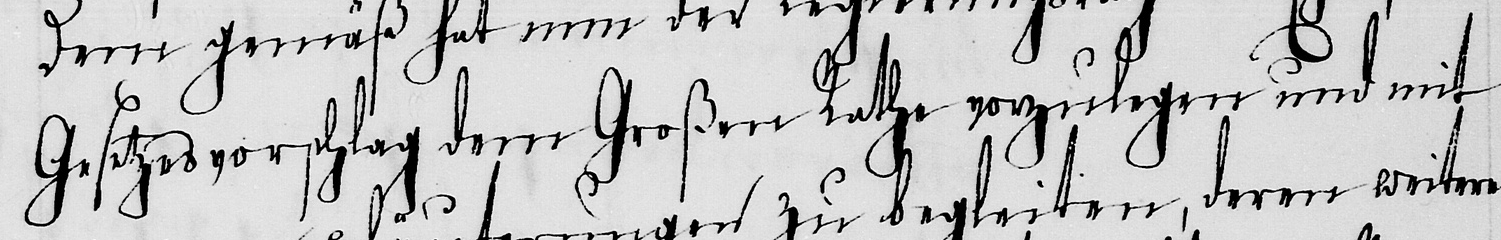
Gesetzesvorschlag dem Großen Rathe vorzulegen und mit
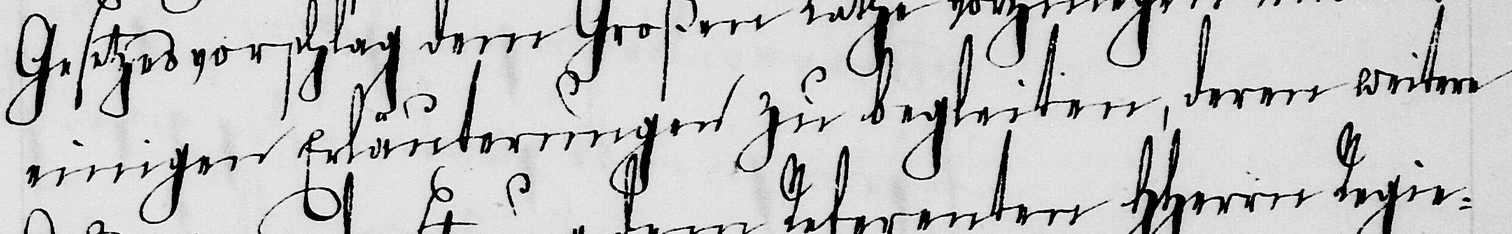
einigen Erläuterungen zu begleiten, deren weitere
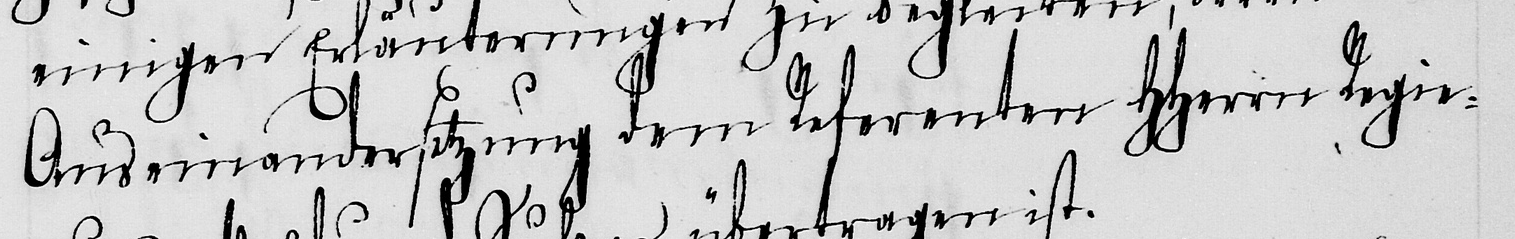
Auseinandersetzung dem Referenten HHerrn Regie¬
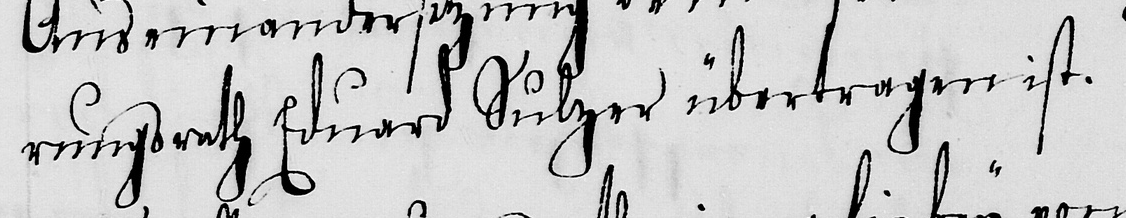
rungsrath Eduard Sulzer übertragen ist.
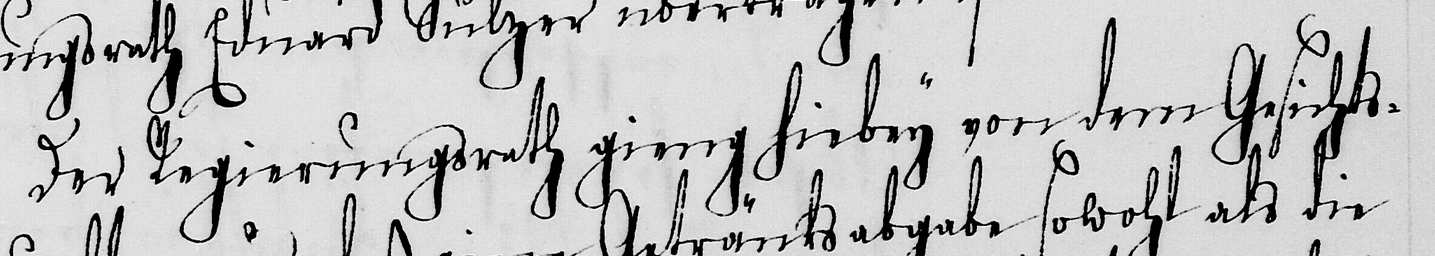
Der Regierungsrath gieng hiebey von dem Gesichts¬
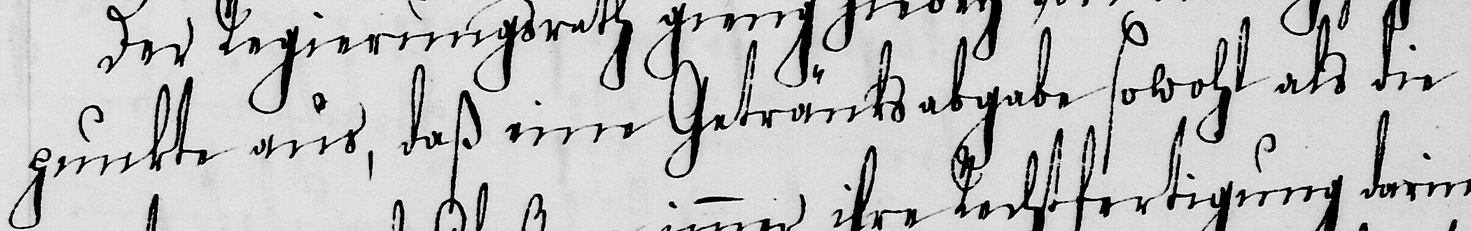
punkte aus, daß eine Getränksabgabe sowohl als die
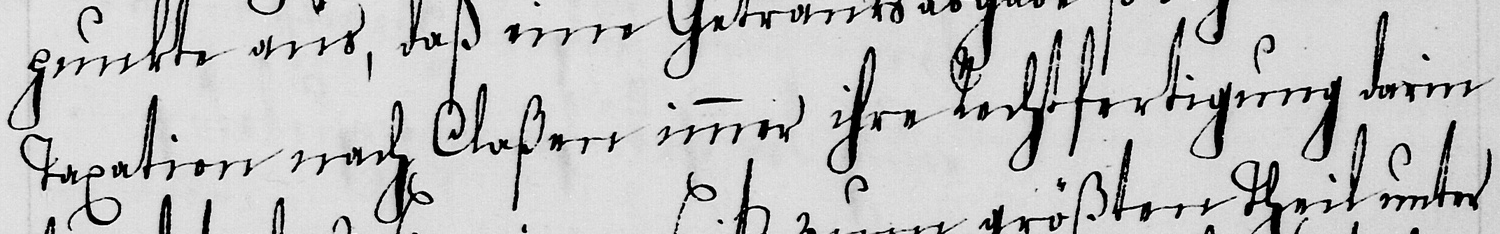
Taxation nach Claßen immer ihre Rechtfertigung darin
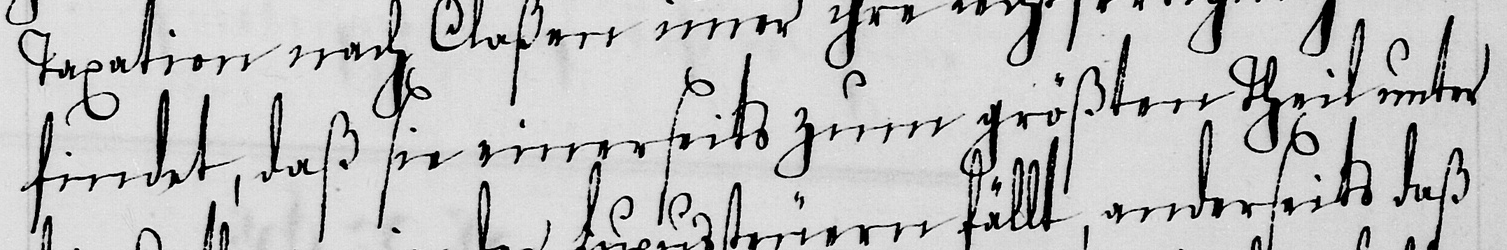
findet, daß sie einerseits zum größten Theil unter
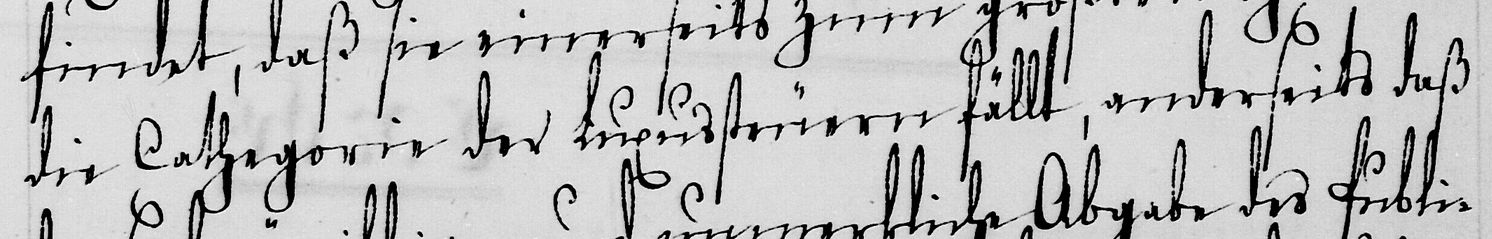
die Cathegorie der Luxussteuern fällt, anderseits daß
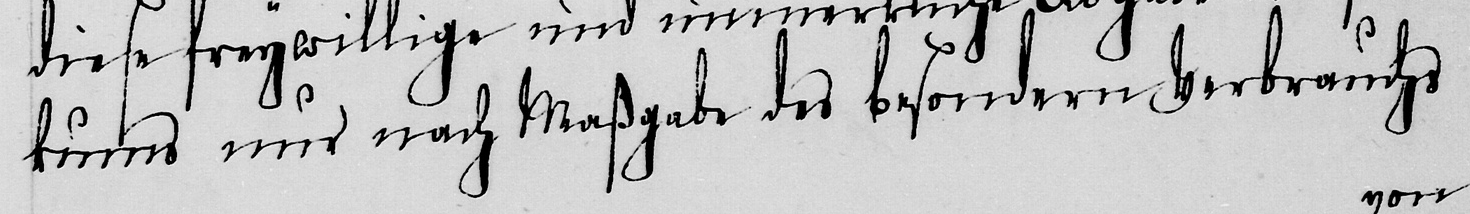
ikums nur nach Maßgabe des besondern Verbrauchs
